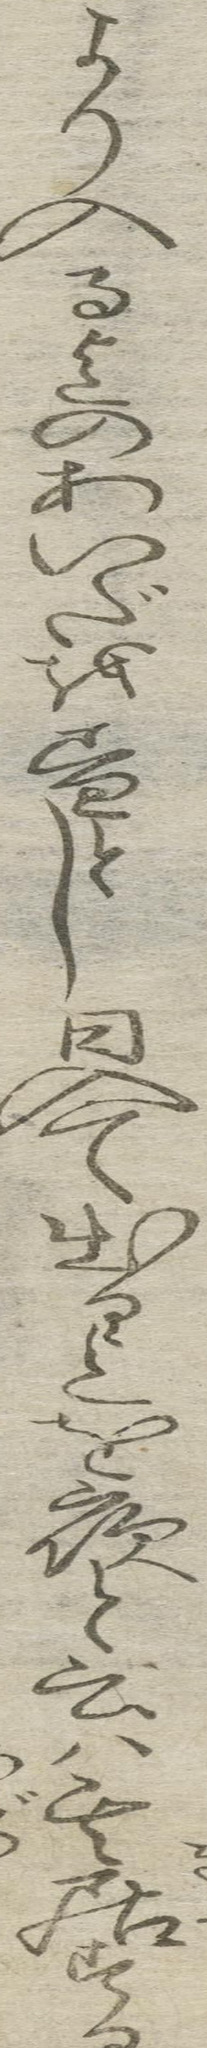より入る迄のあいだを昼とし日入て出ることを夜と云は其居する
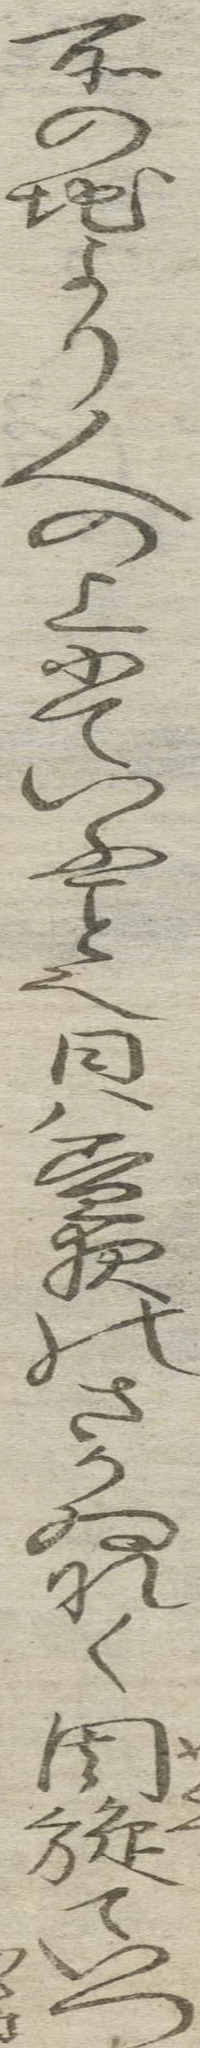所の地より人の上にていふこと也日は昼夜のさかゐなく周旋ていつ
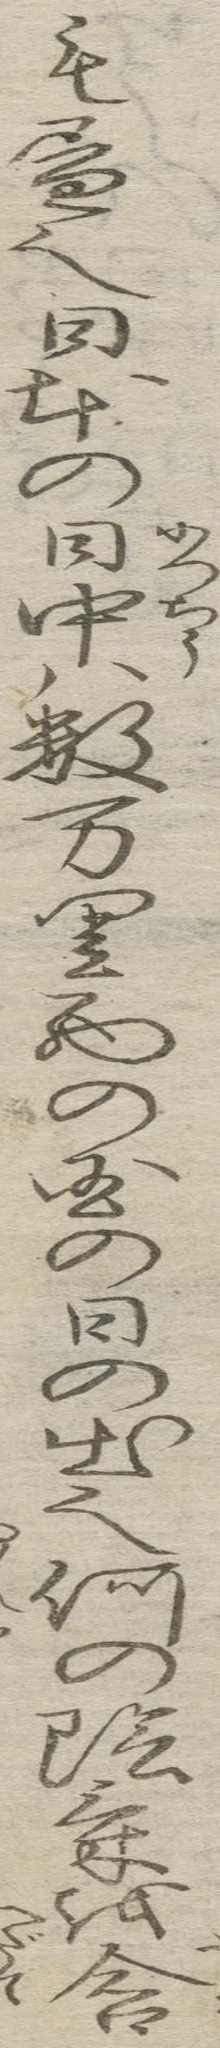も昼也日本の日中は数万里西の国の日の出也何の陰気を含
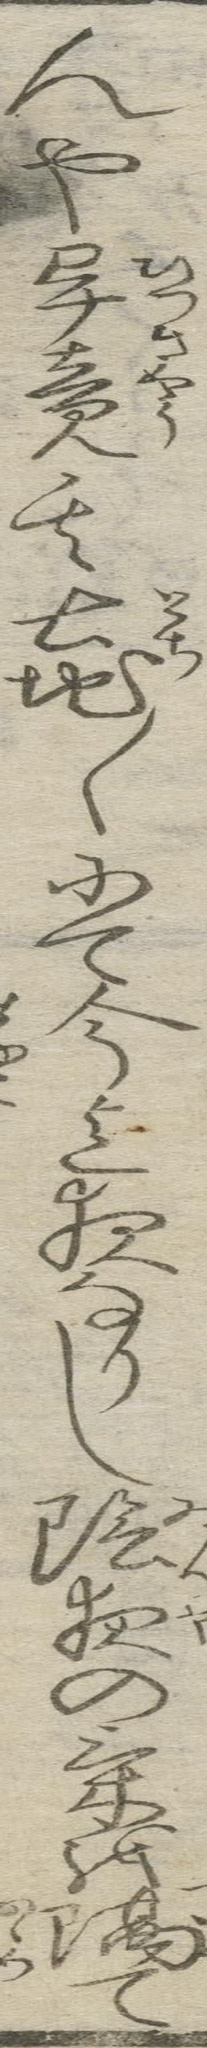んや畢竟其土地〳〵にて今迄夜なりし陰夜の気を隔て
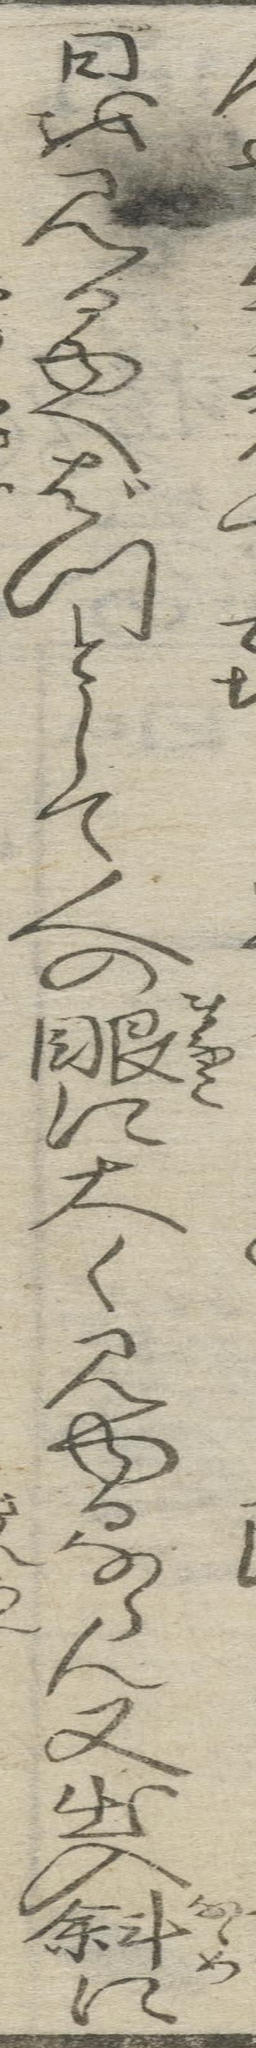日を見るゆへばつとして人の眼に大く見ゆるならん又出入斜に
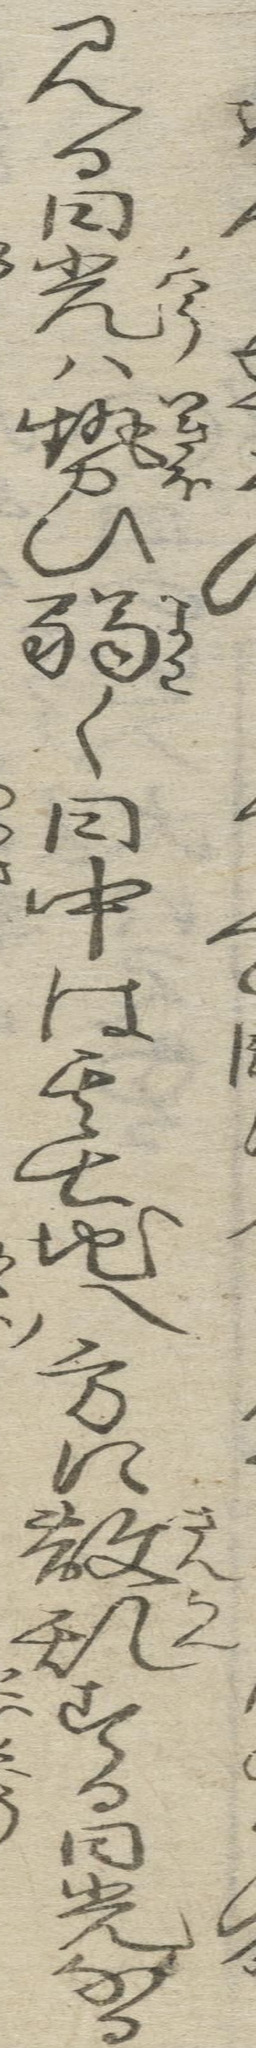見る日光は勢ひ弱く日中は其土地八方に精光のみを
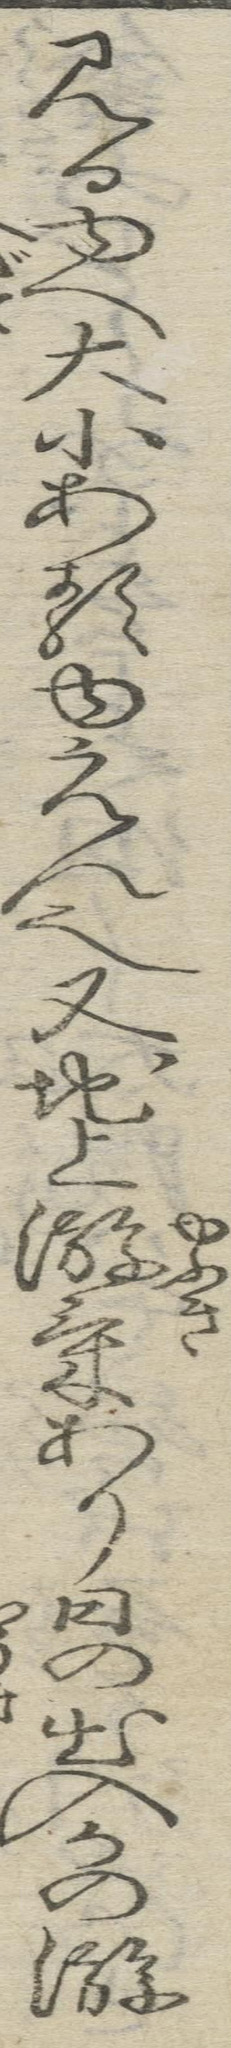見るゆへ大小あるゆえん也又地上游気あり日の出入かの游
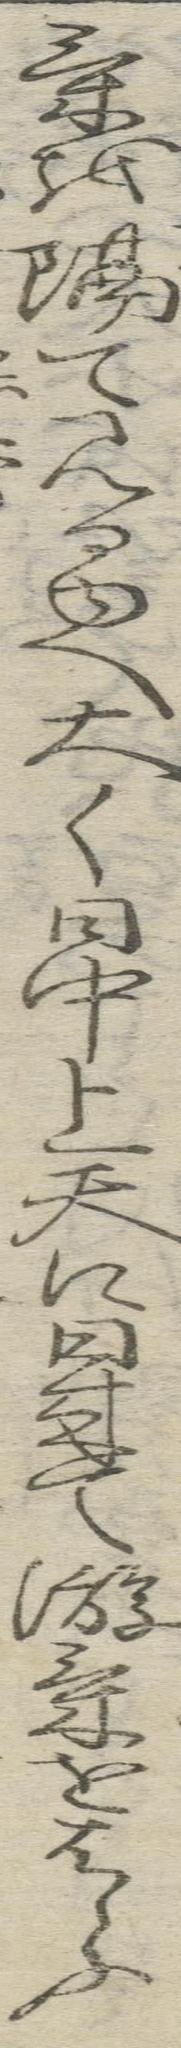気を隔て見るゆへ大く日中上天に日来て游気をはらふ
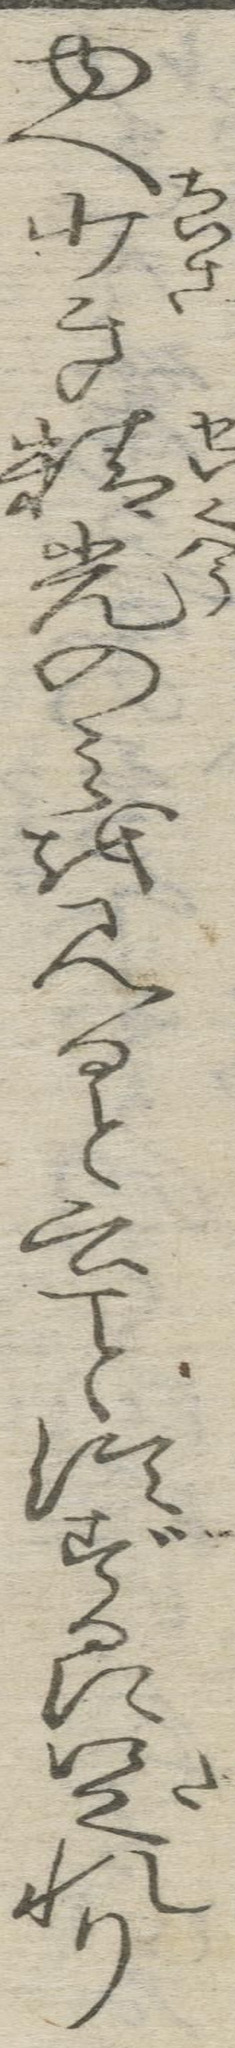ゆへ少き精光のみを見ると云こと信ずるに足れり
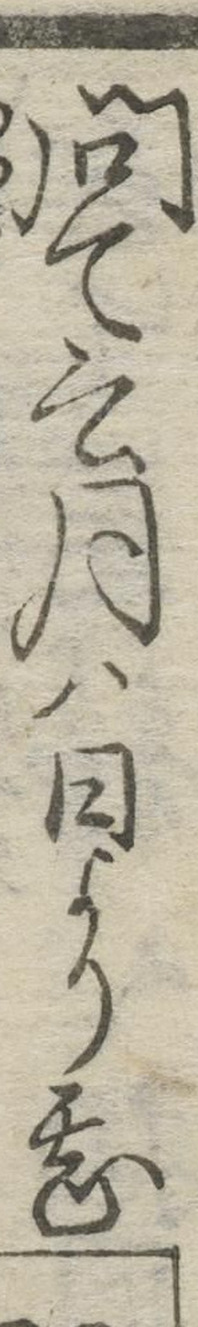問て云月は日より甚
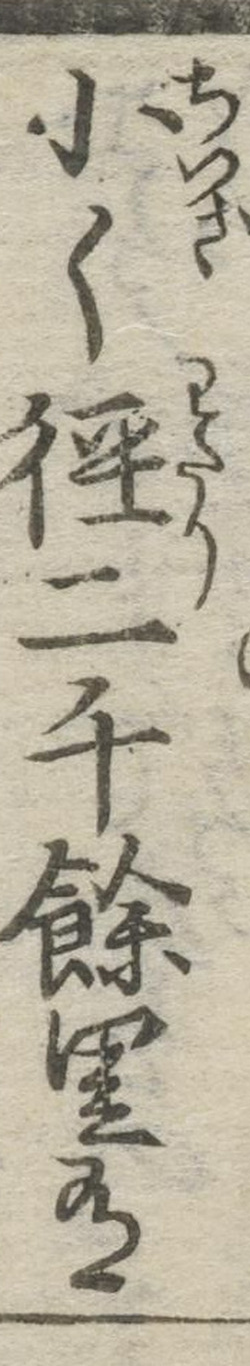小く径二千余里有
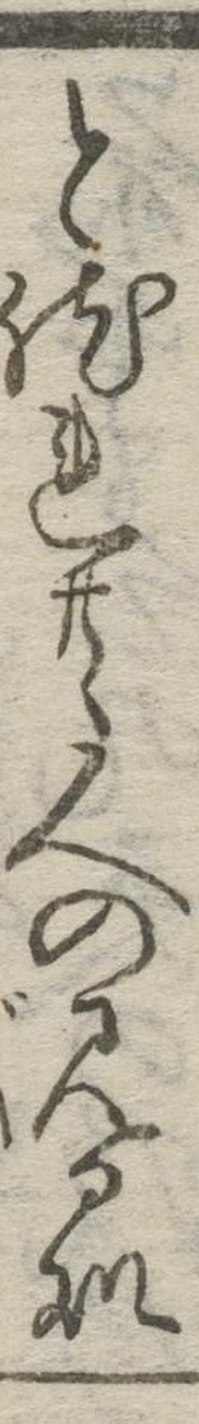と然れ共人の見る処
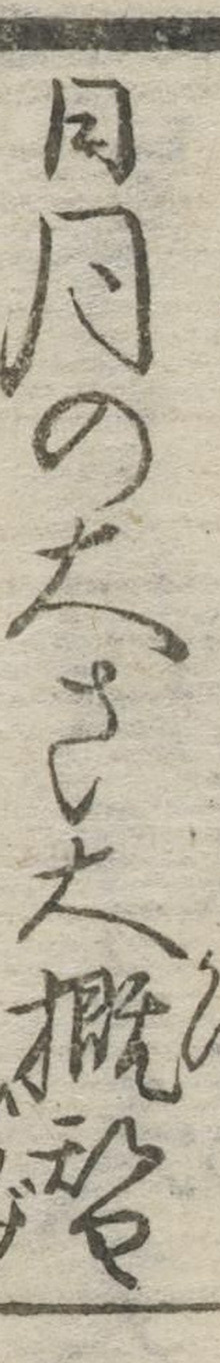日月の大さ大概替
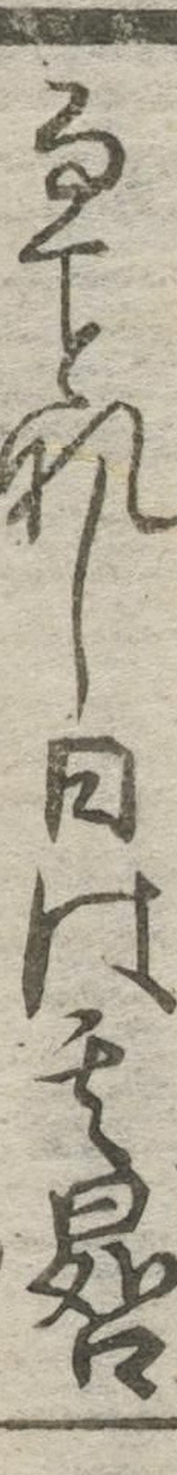ることなし日は其晷
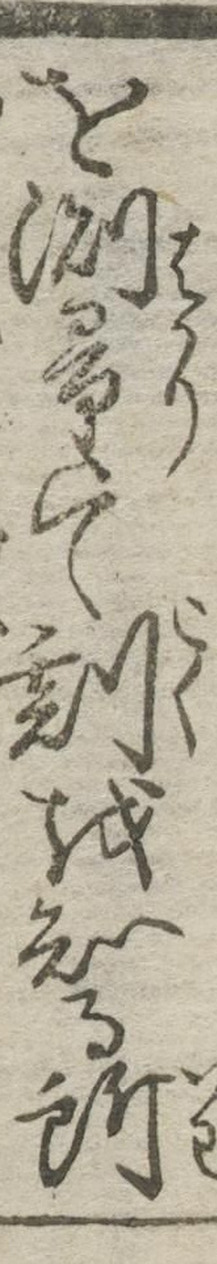を測量て刻を知る所
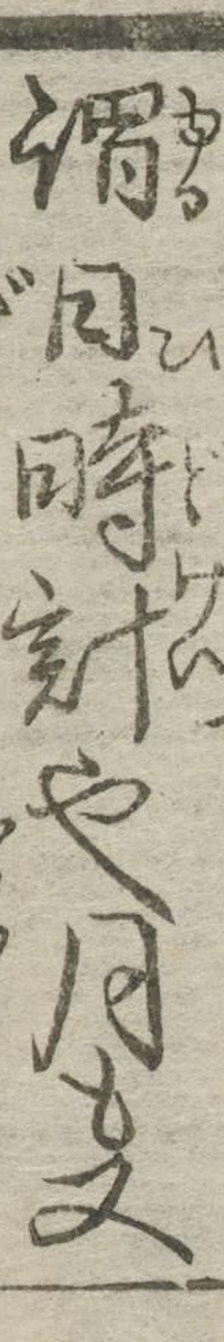謂日時計也月も又
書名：訓蒙天地辨　天
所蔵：東京大学地震研究所図書室 Earthquake Research Institute Library, The University of Tokyo, JAPAN
